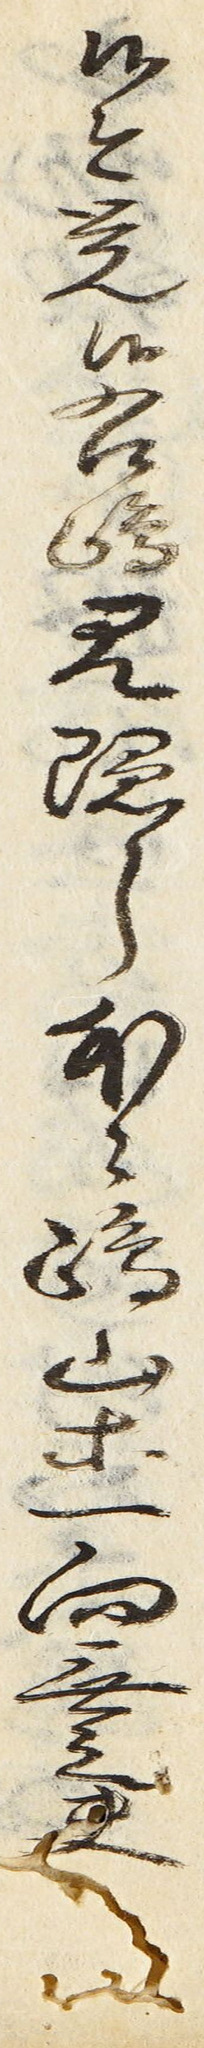候と覚候右嶋見隠し外ニ嶋山等一向無之夫
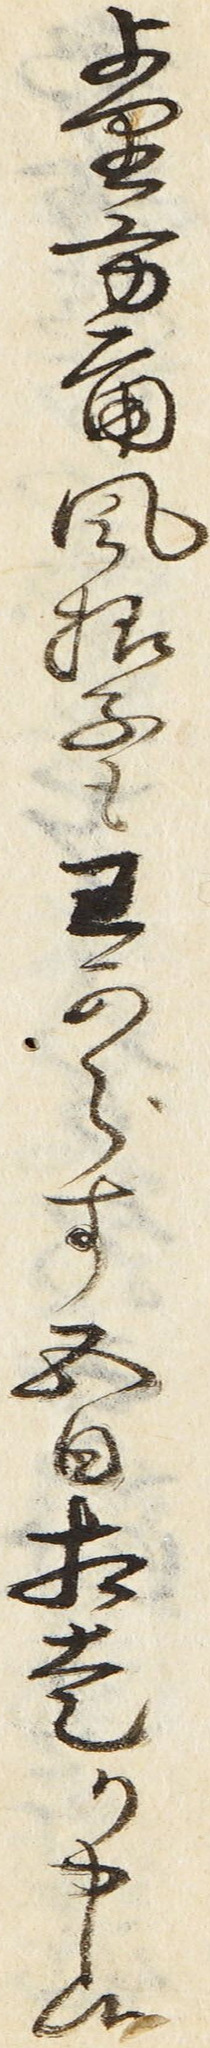より方角風様子もわからす五日相走り申候
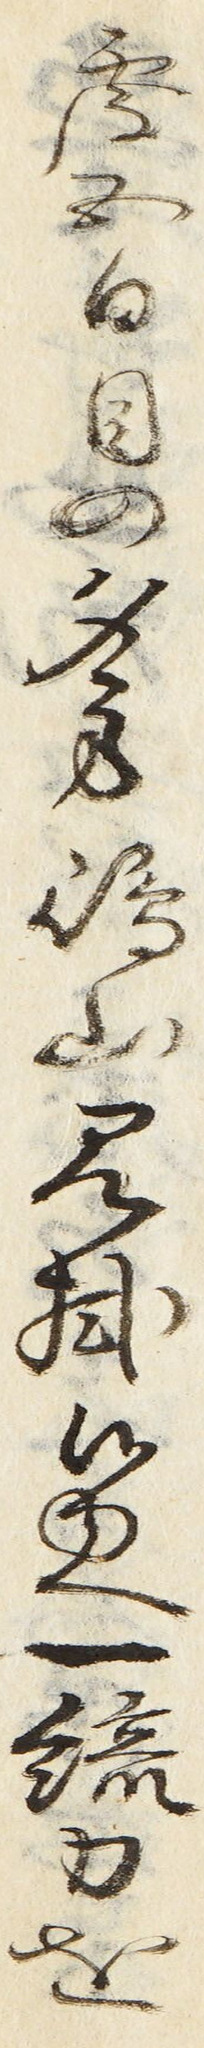処五日目の夕方嶋山見掛候ゆへ一統力を
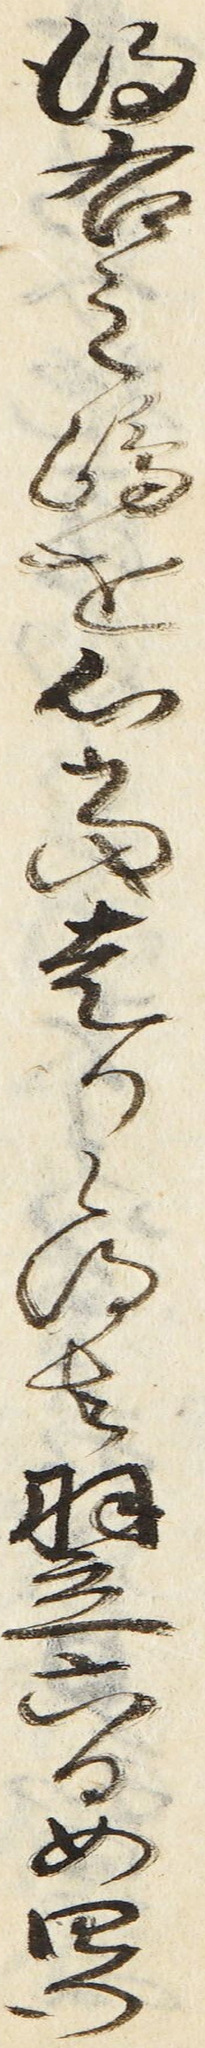得右之嶋を心当走り候得者翌六日め四ツ
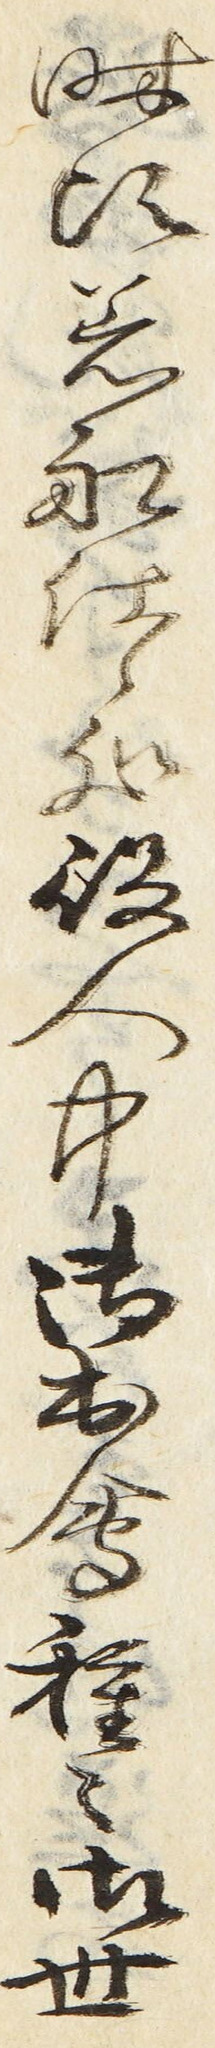時頃着船仕候処役人中御出会種々御世
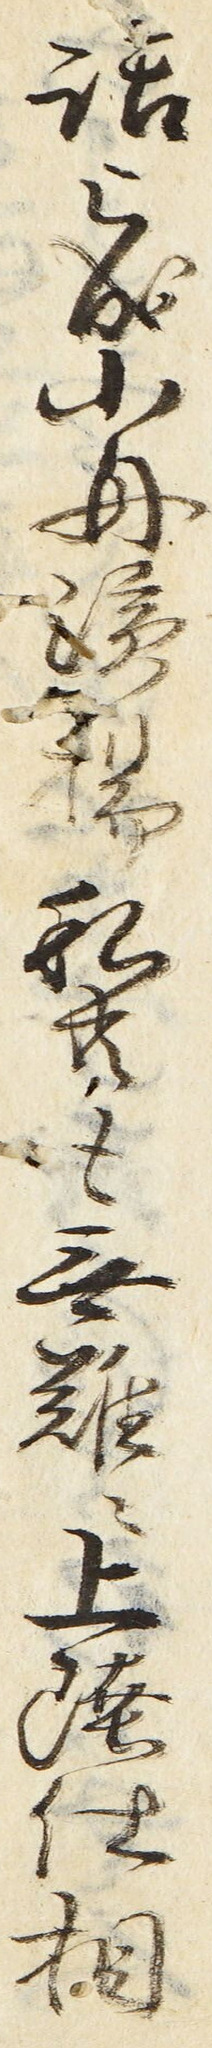話被成小舟浜揚私共も無難ニ上陸仕相
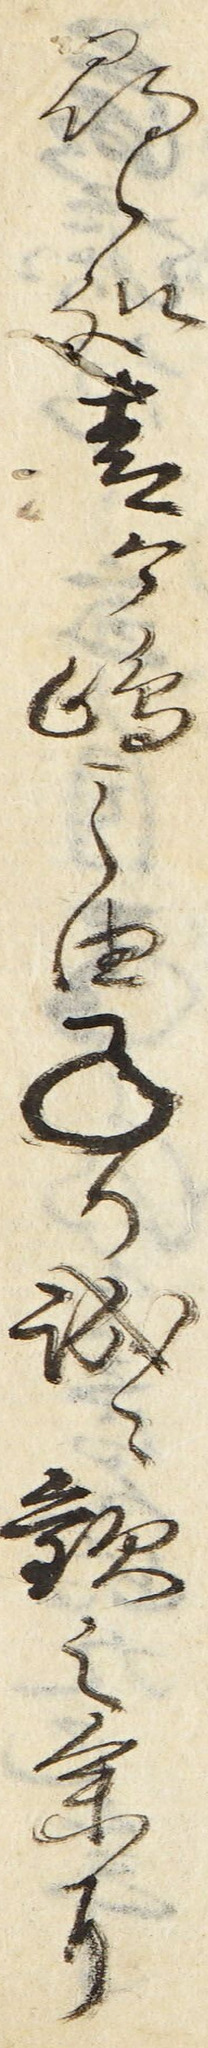尋候処青ケ嶋之由承り誠ニ歓之余に

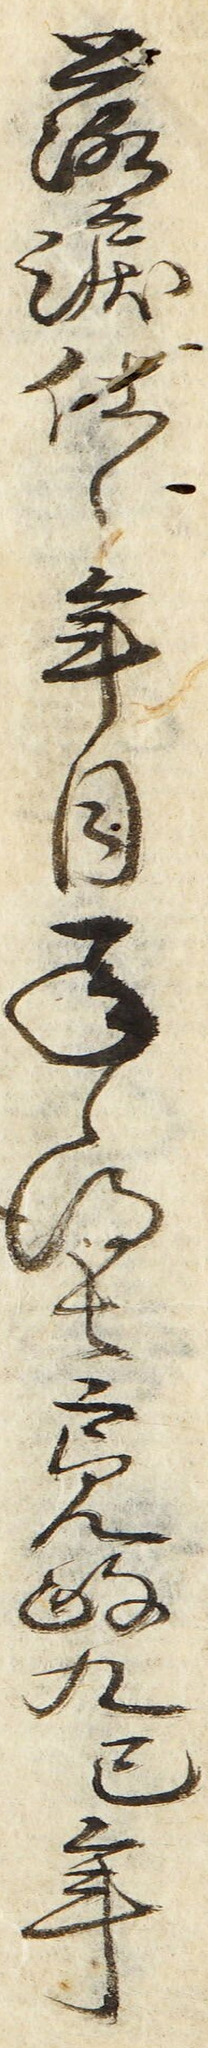落涙仕候年月承候得者寛政九巳年
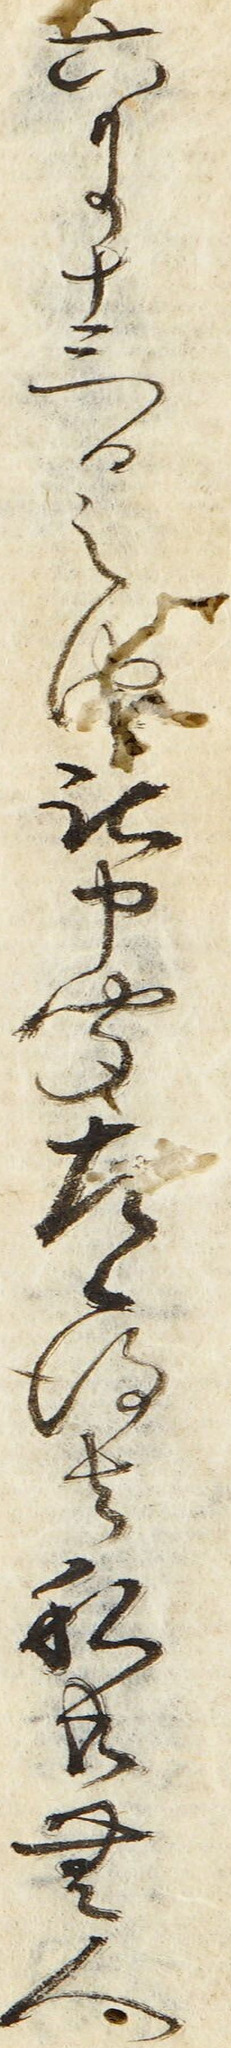六月十三日之由被申聞左候得者私共無人
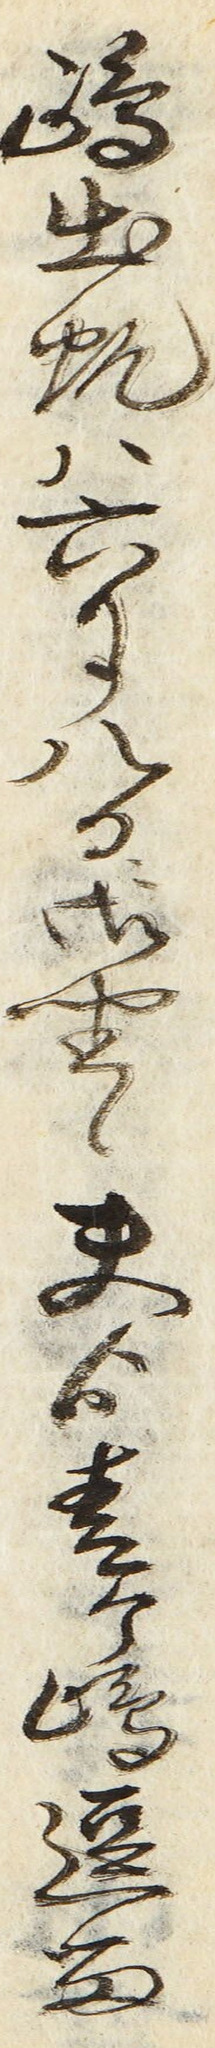島出帆ハ六月八日御座候夫ゟ青ケ嶋逗留
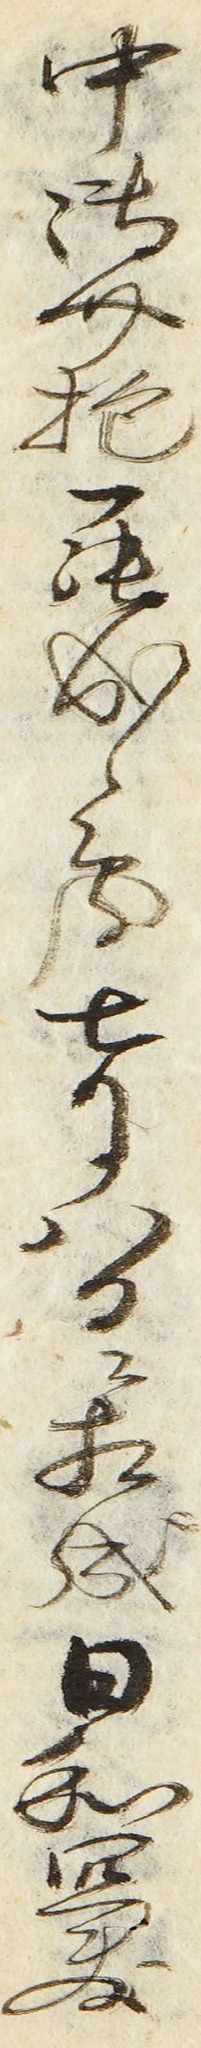中御介抱罷成候処七月八日ニ相成日和宜敷
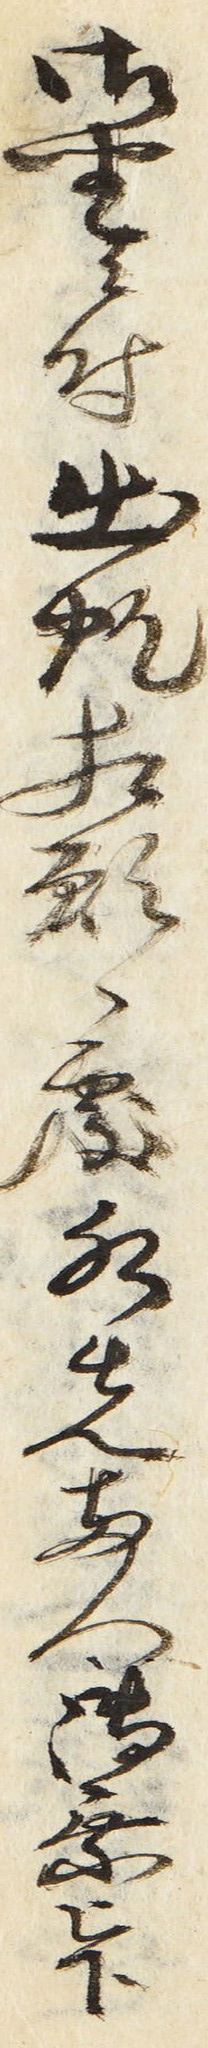御座候ニ付出帆相願候処水先両人御乗被下
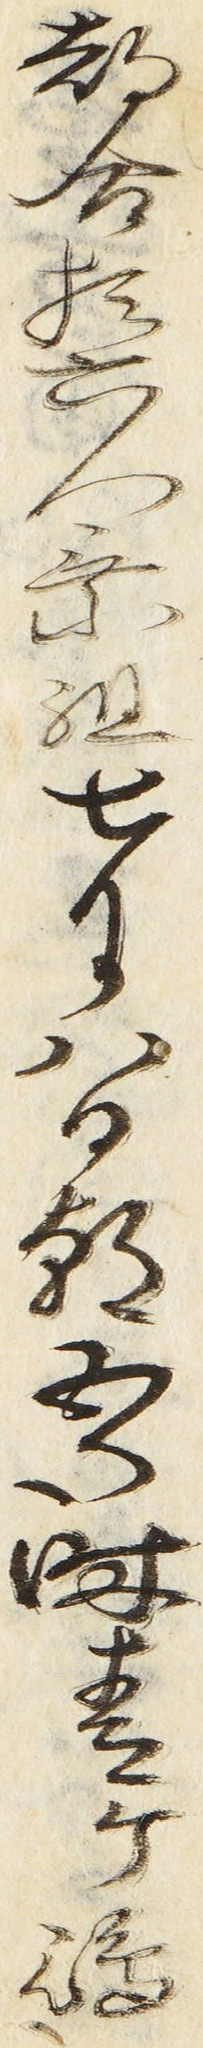都合拾六人乗組七月八日朝五ツ時青ケ嶋
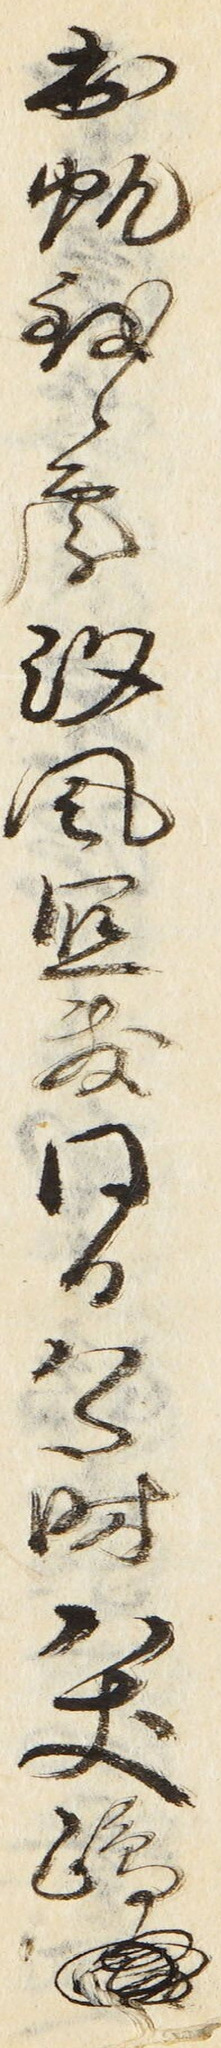出帆致候処汐風宜敷同日八ツ時八丈島
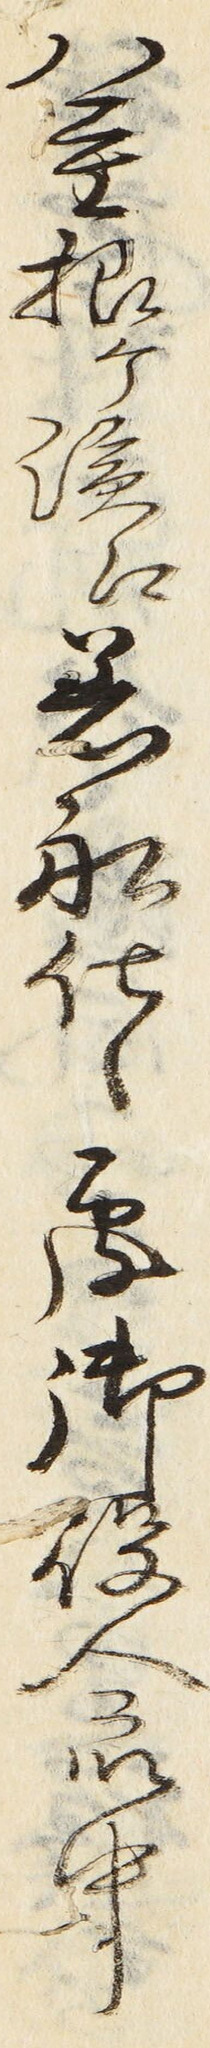八重根ケ浜江着船仕候処御役人衆中
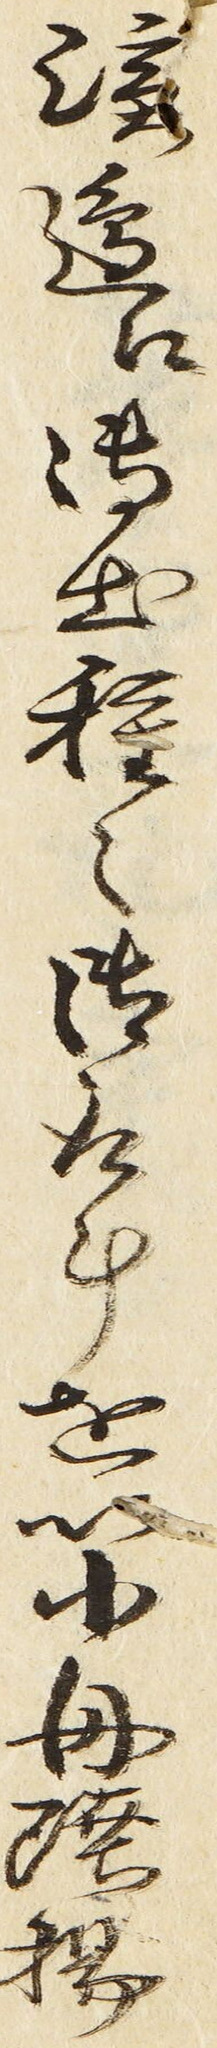浜辺江御出種々御取計を以小舟陸揚
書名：漂流一件上書
